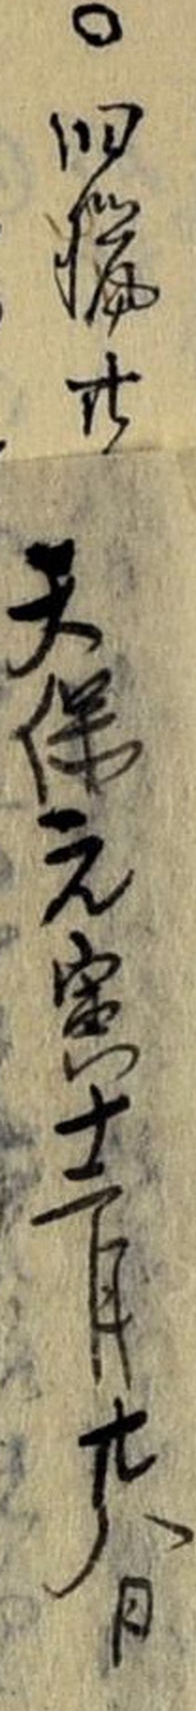天保元寅十二月廿八日
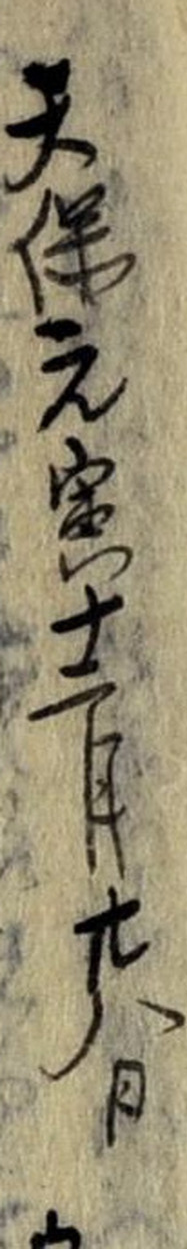天保元寅十二月廿八日
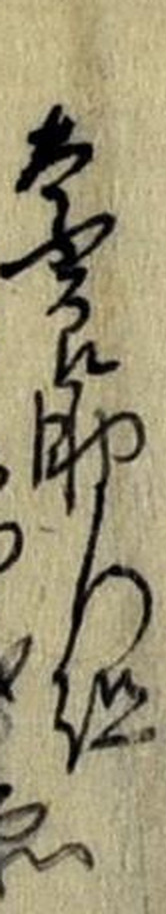奈良助右衛門組
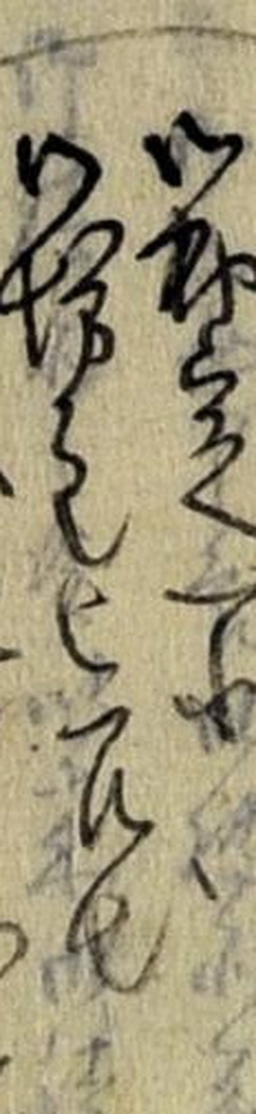御坊主被召出忰
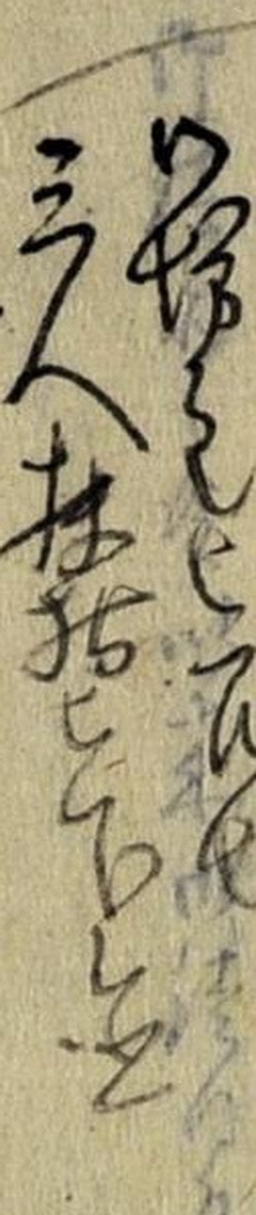三人扶持被下置
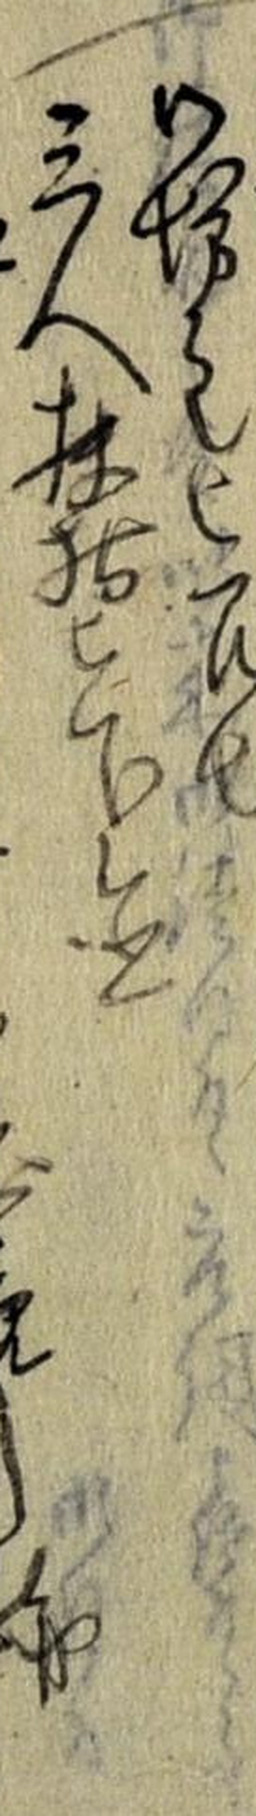三人扶持被下置
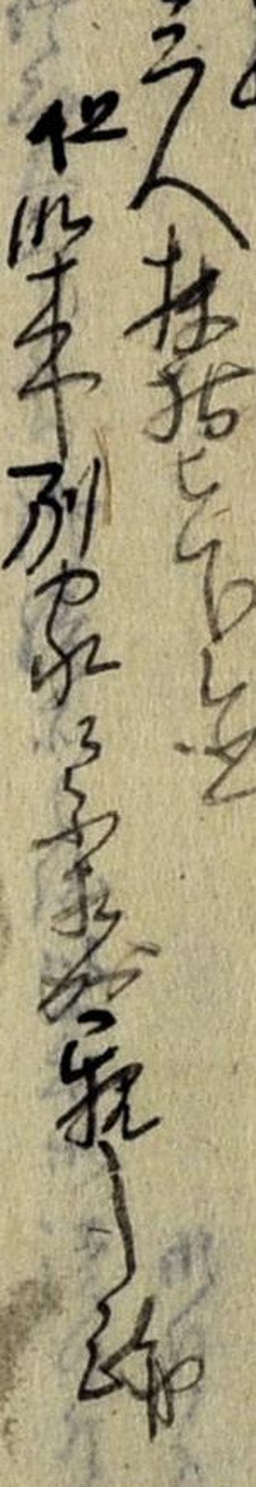但以来別家ニ不相成親之跡

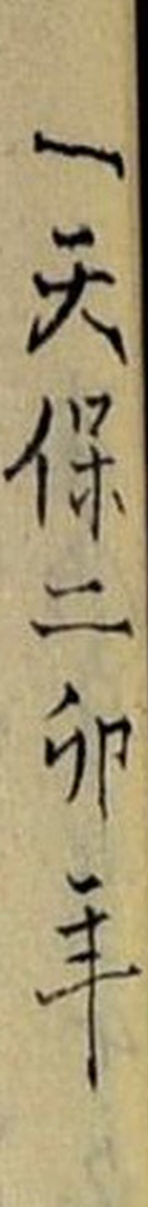一天保二卯年
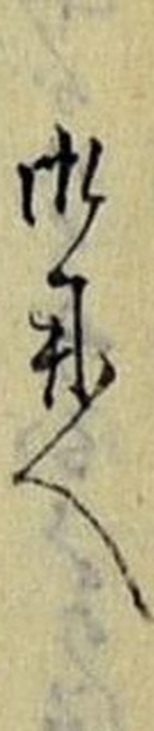御用人
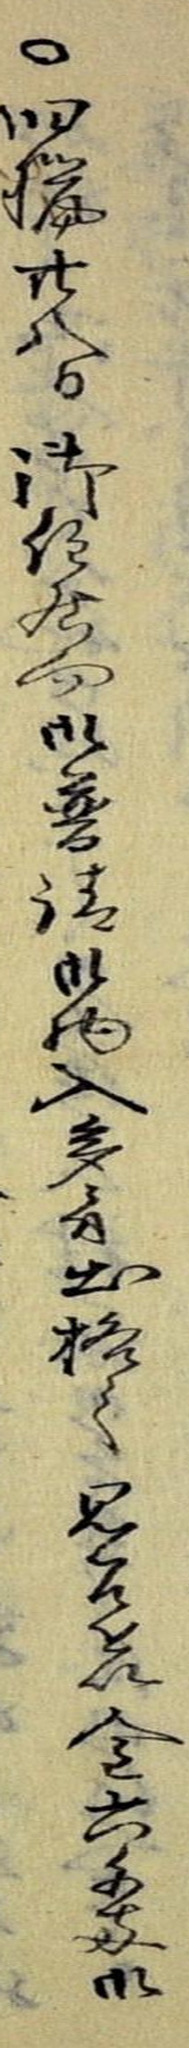〇旧臘廿八日御住居向御普請御物入多ニ付出格之思召を以金六千両御
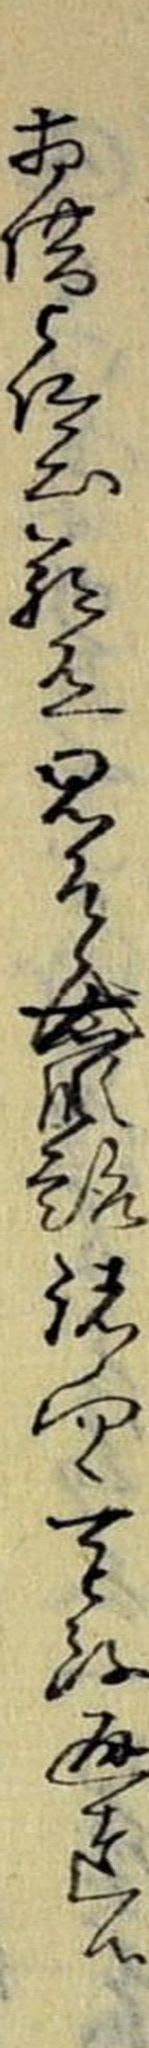拝借被仰出難有思召候右之趣諸向へ可被致通達候
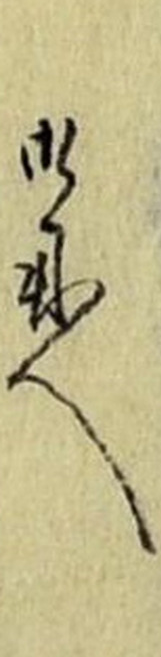御用人
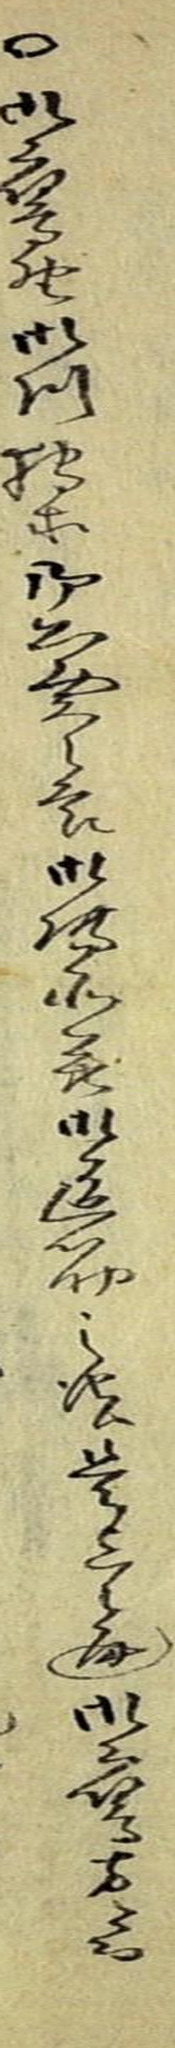〇御鷹野御川狩等御出殿之節御場所并御道筋之儀ハ是迄之通御鷹方ニ而
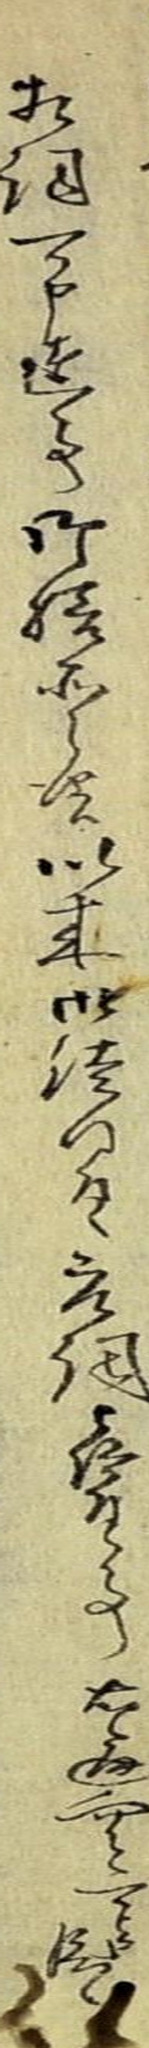相調可申達事御膳所之儀ハ以来御徒目付へ取調被仰付候事右之通向々へ可被申渡候
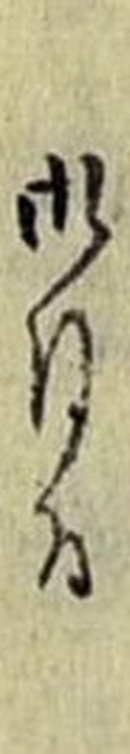御目付
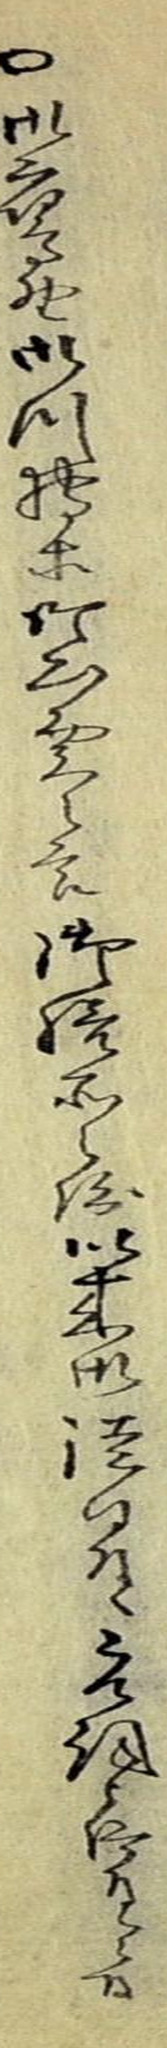〇御鷹野御川狩等御出殿之節御膳所之儀以来御徒目付へ取調被仰付候ニ付
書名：命令之部 五
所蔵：福井県文書館 Fukui Prefectural Archives
